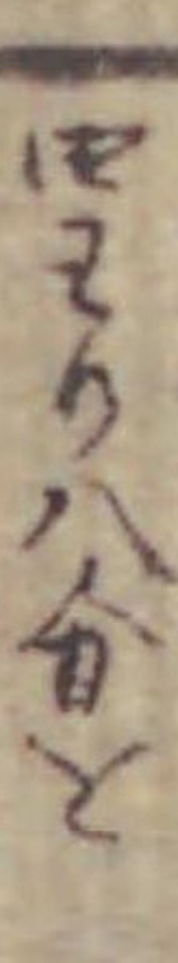四わり八分を
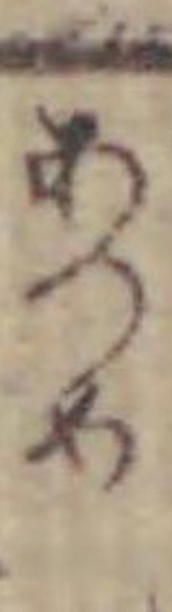あつめ
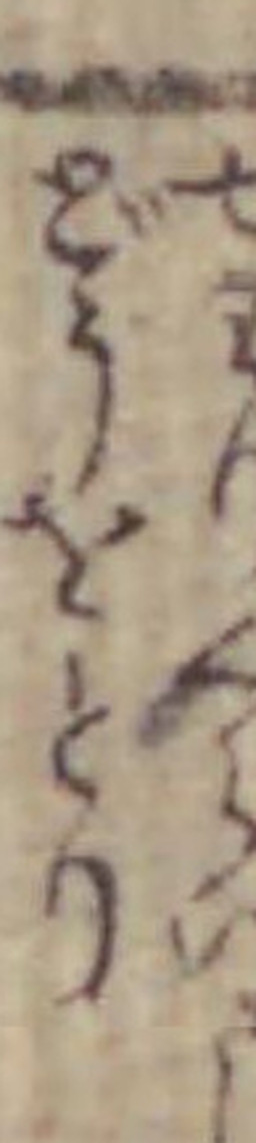どうをとり
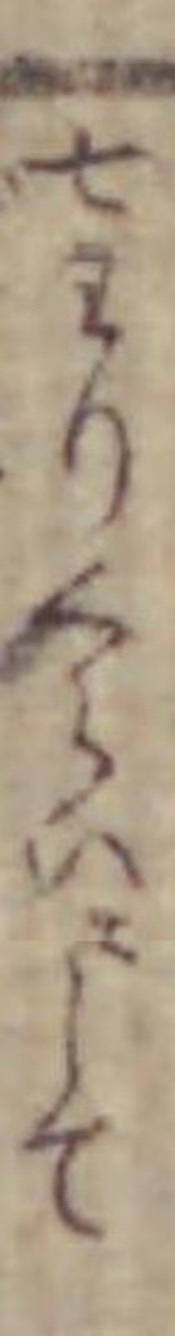七わりくらいにして
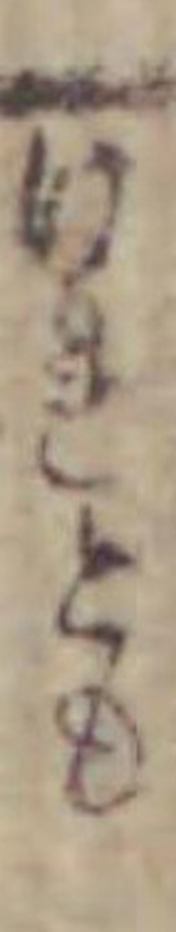けれとも
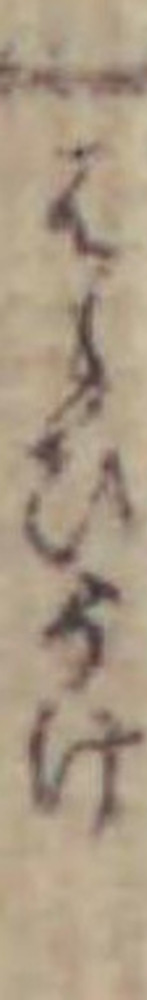はらひうけ
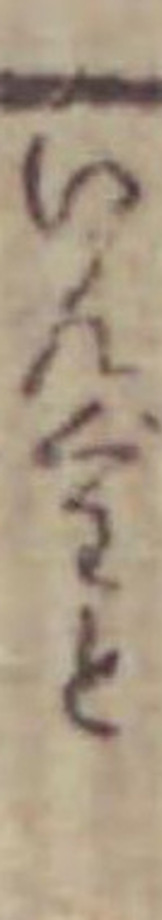いんぐわと
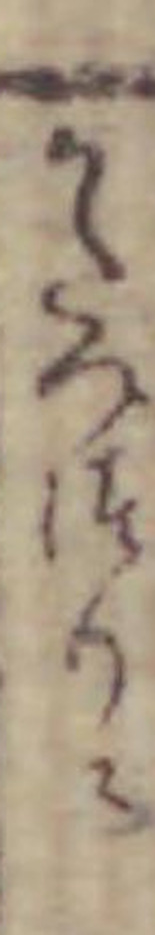かたつつりに
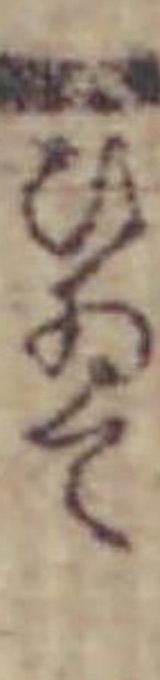ひゐて

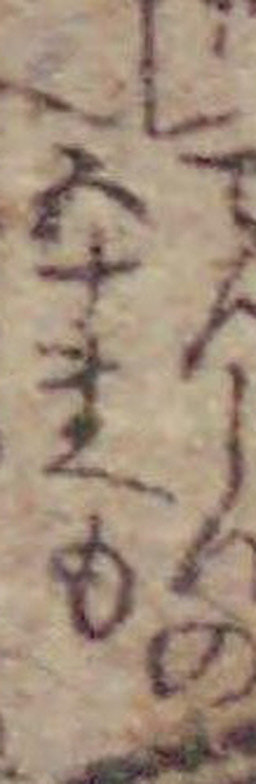五十まへも
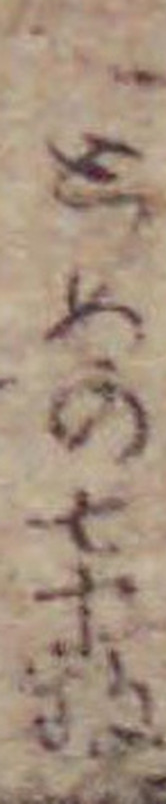とめの七十枚
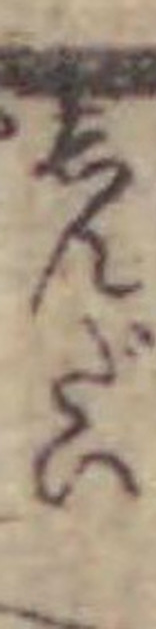しんだい
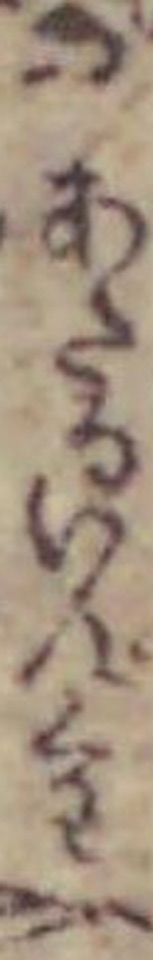あたるいんくわ
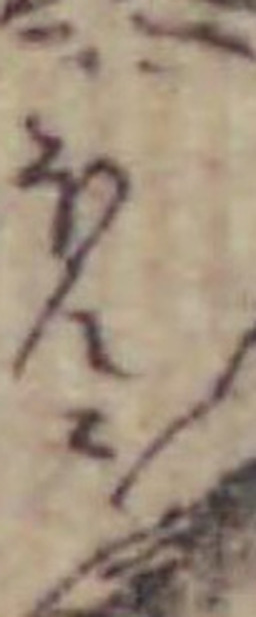ほんに
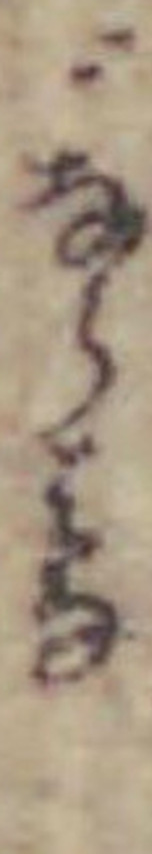ならはな
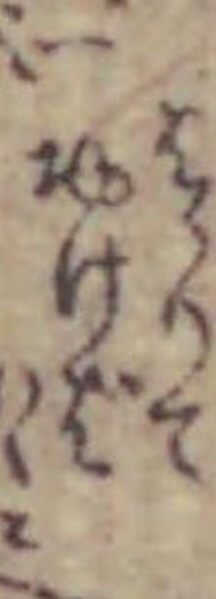おけば
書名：莫切自根金生木 : 3巻
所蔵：国立国会図書館 National Diet Library, JAPAN
